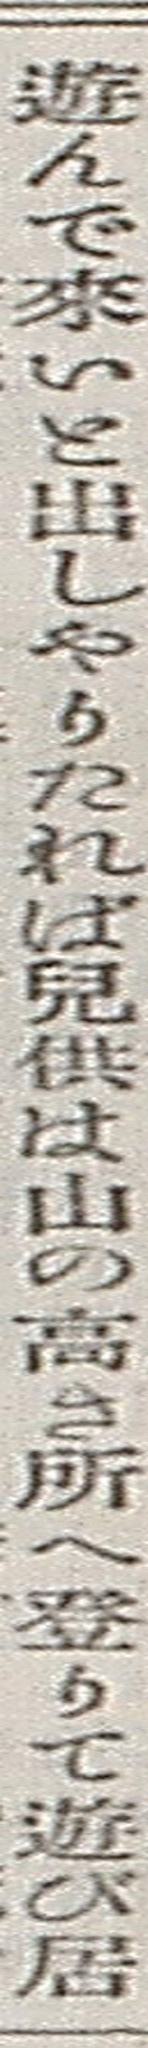遊んで来いと出しやりたれば兒供は山の高き所へ登りて遊び居
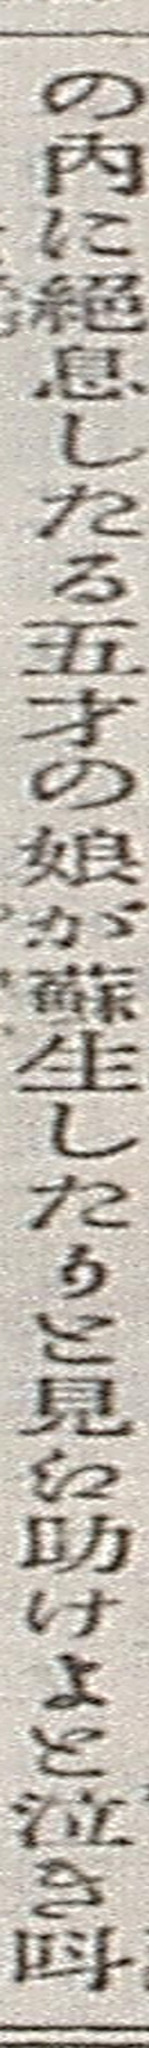の内に絶息したる五才の娘が蘇生したりと見え助けよと泣き叫
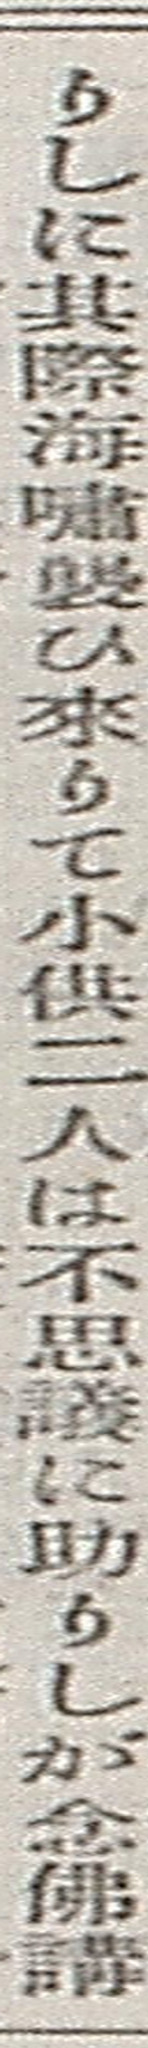りしに其際海嘯襲ひ来りて小供二人は不思議に助りしが念佛講
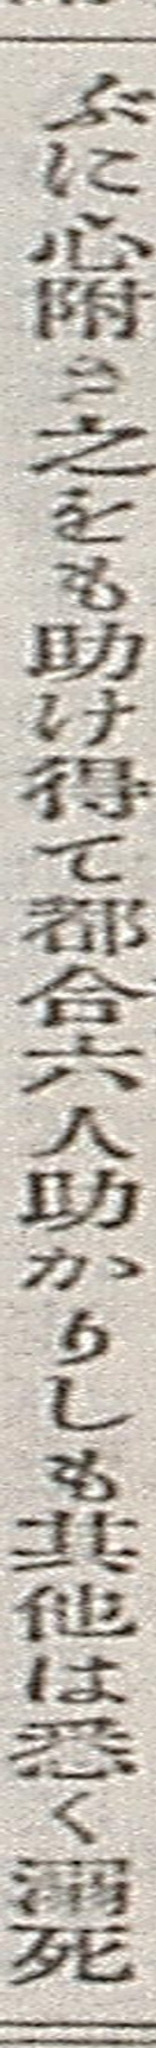ぶに心付き之をも助け得て都合六人助かりしも其他は尽く溺死
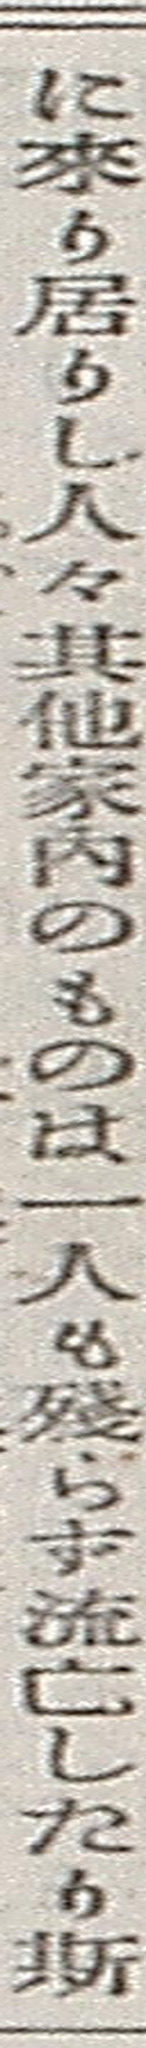に来り居りし人々其他家内のものは一人も残らず流亡したり斯
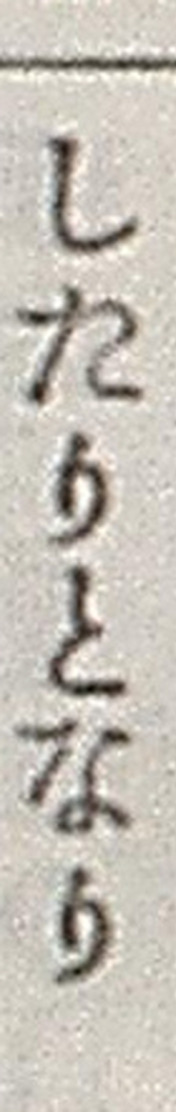したりとなり
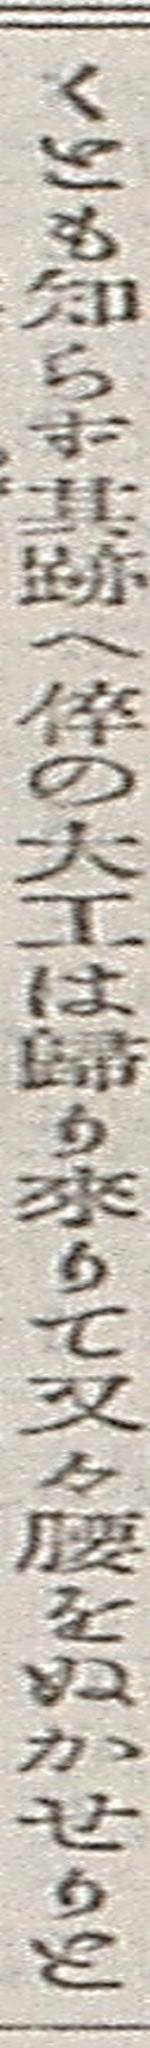くとも知らず其跡へ悴の大工は帰り来りて又々腰をぬかせりと
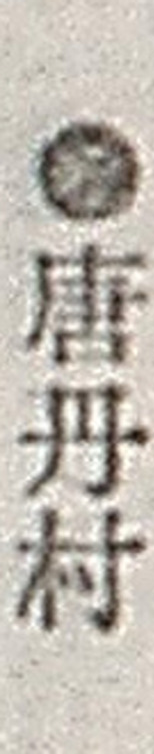●唐丹村
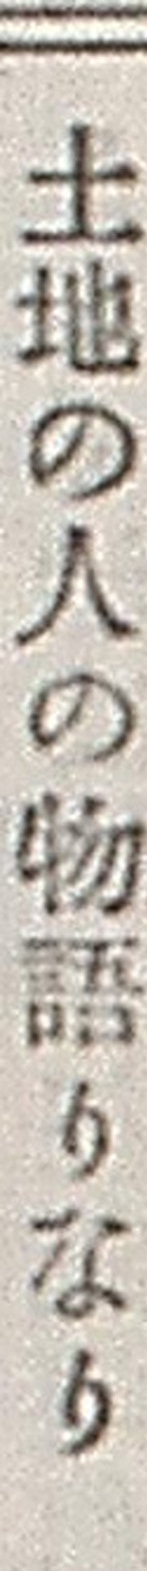土地の人の物語りなり
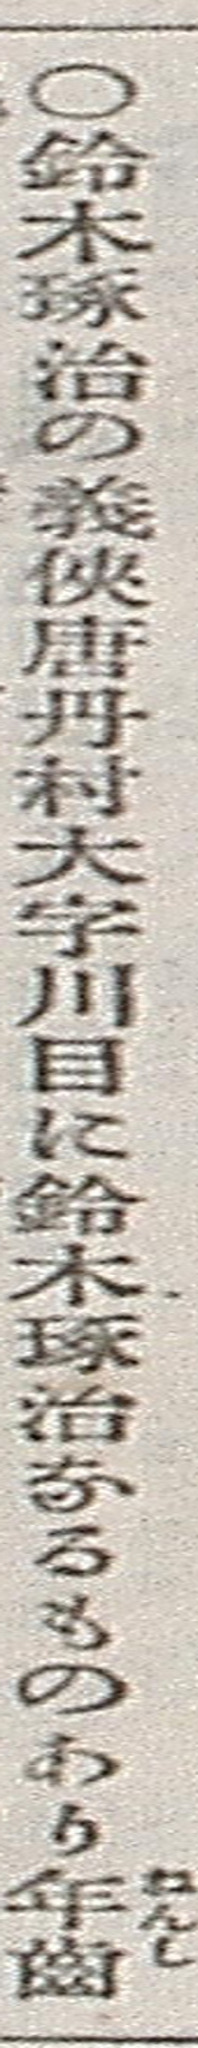○鈴木琢治の義侠唐丹村大字川目に鈴木琢治なるものあり年歯
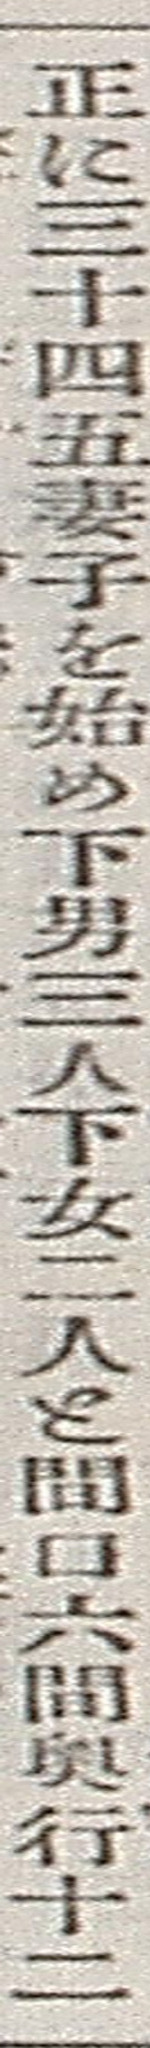正に三十四五妻子を始め下男三人下女二人と間口六間奥行十二
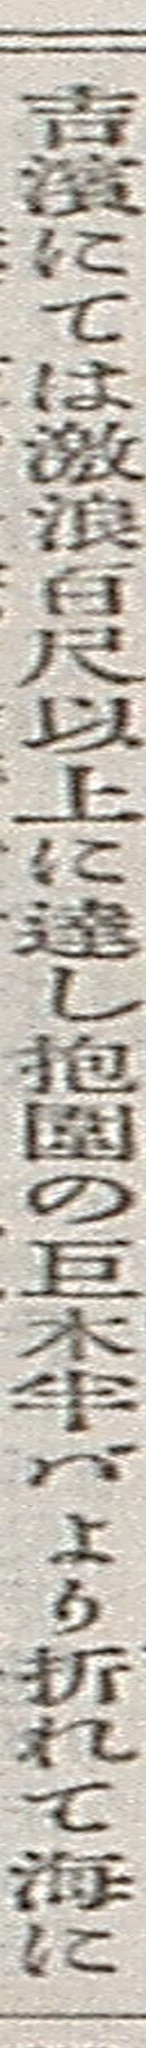吉浜にては激浪百尺以上に達し抱囲の巨木半バより折れて海に
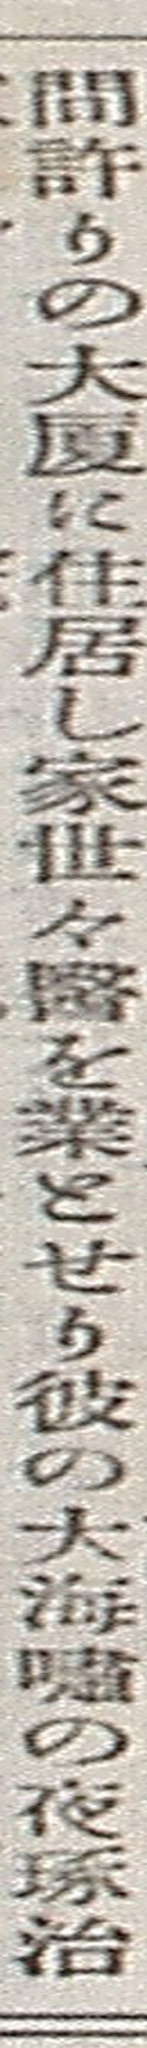間許りの大厦に住居し家世々医を業とせり彼の大海嘯の夜琢治
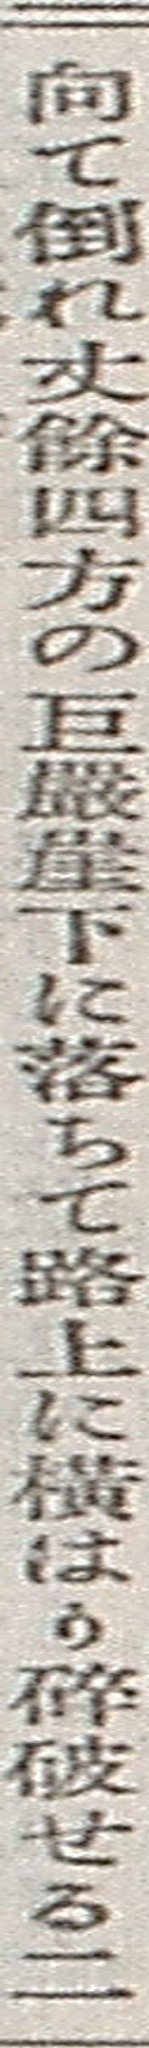向て倒れ丈余四方の巨巌崖下に落ちて路上に横はり砕波せる二
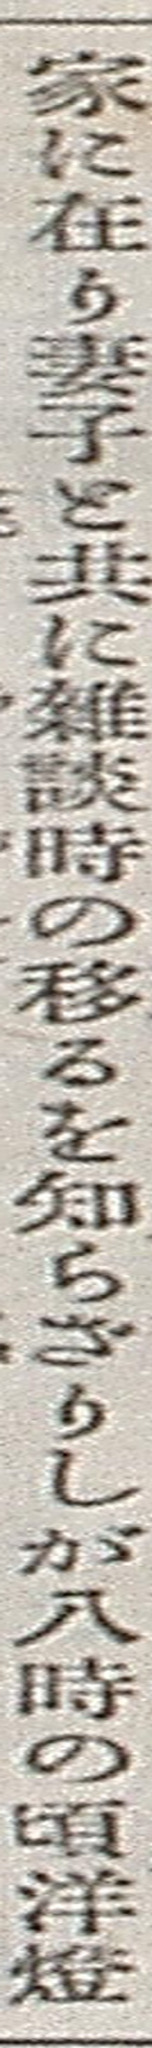家に在り妻子と共に雑談時の移るを知らざりしが八時の頃洋灯
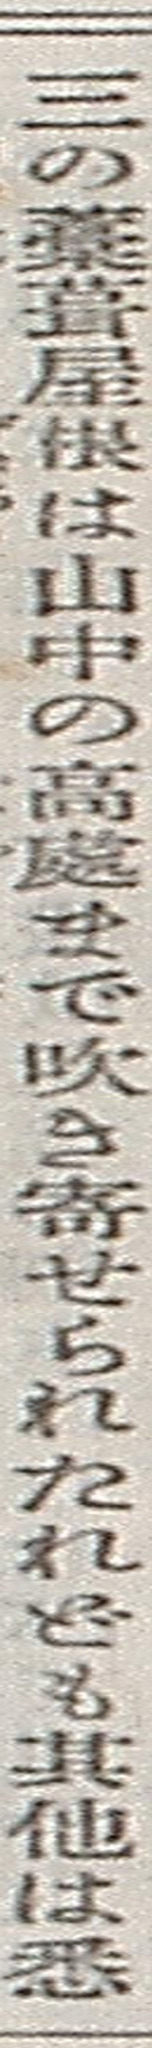三の藁葺屋根は山中の高処まで吹き寄せられたれども其他は悉
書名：風俗畫報臨時増刊第百二十號　大海嘯被害録（下）
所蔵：東京大学地震研究所図書室 Earthquake Research Institute Library, The University of Tokyo, JAPAN
